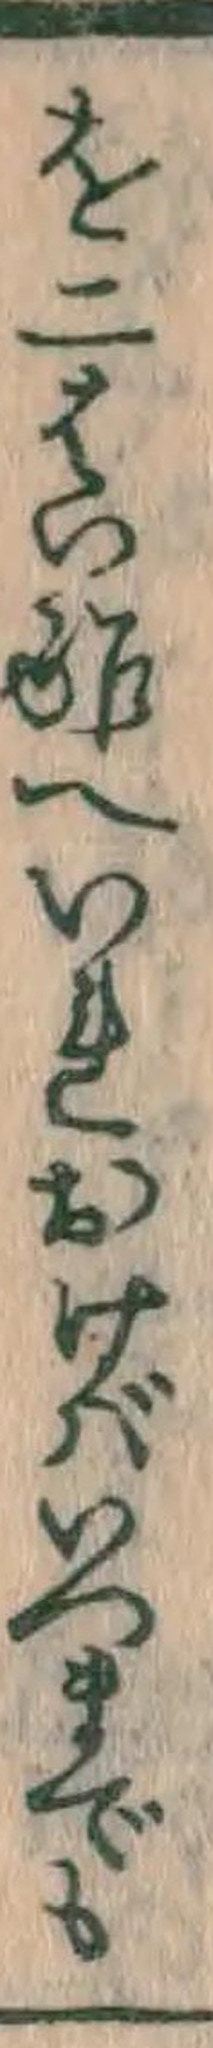を二はい酢へいれおけばいつまでも
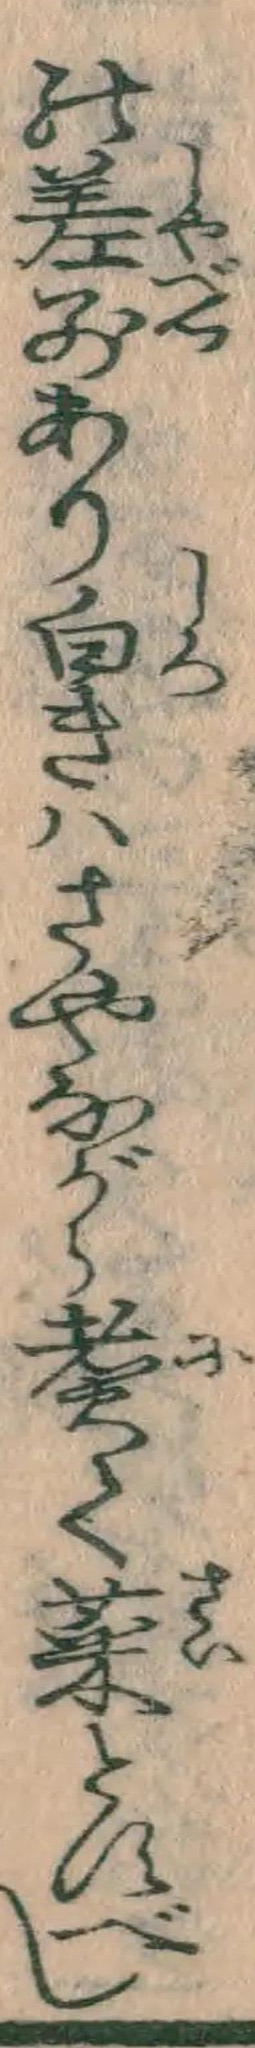の差別あり白きはさやながら煮て菜とすべし
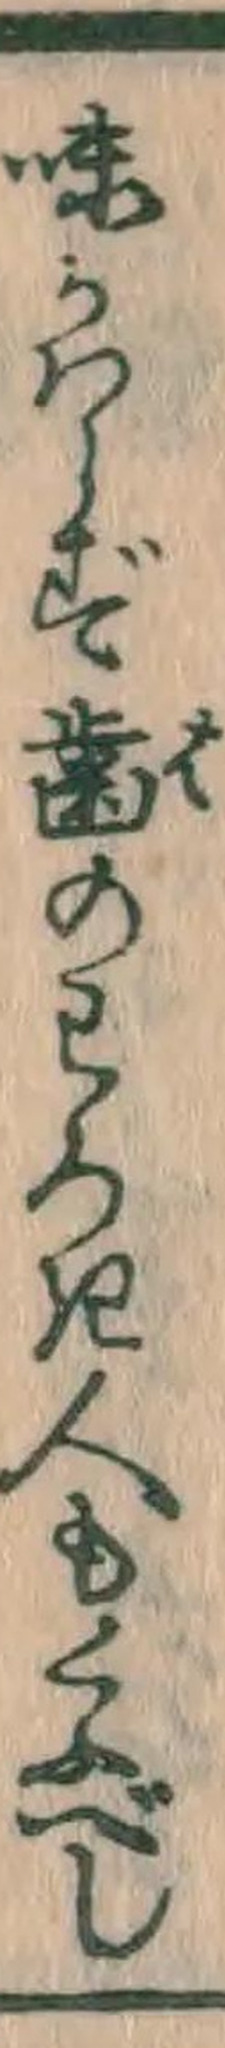味かはらず歯のわろき人もくふべし
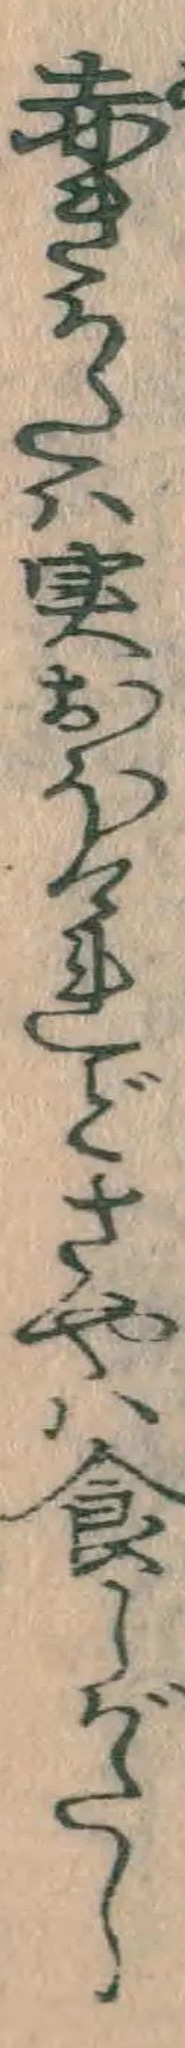赤きかたは実おほけれどさやは食しがたし
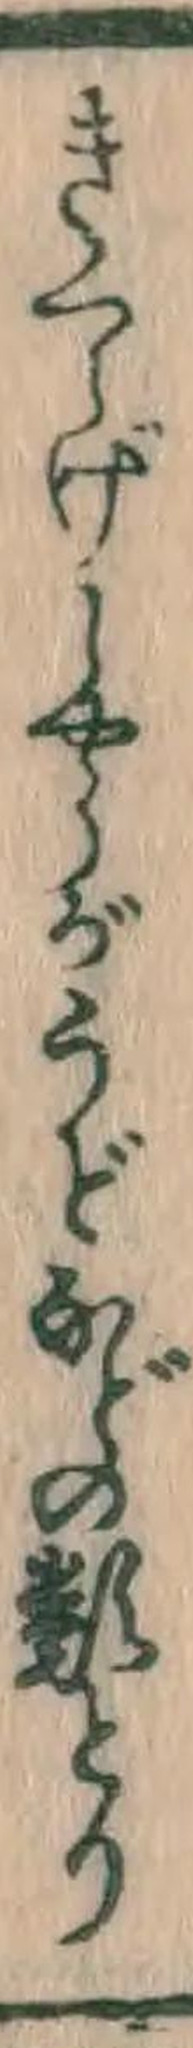きくらげしやうがうどなどの類とり
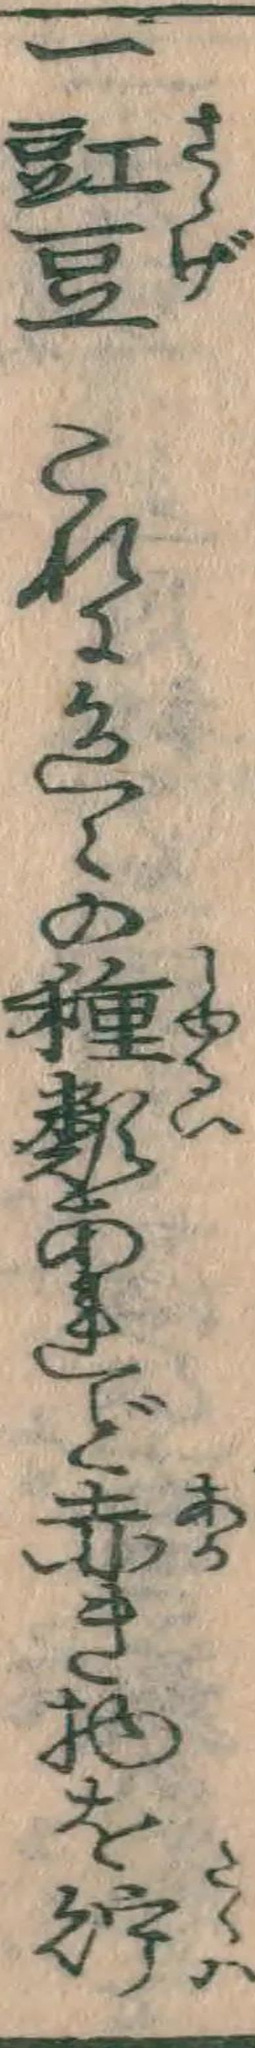一豇豆これに色々の種類あれど赤き物を貯
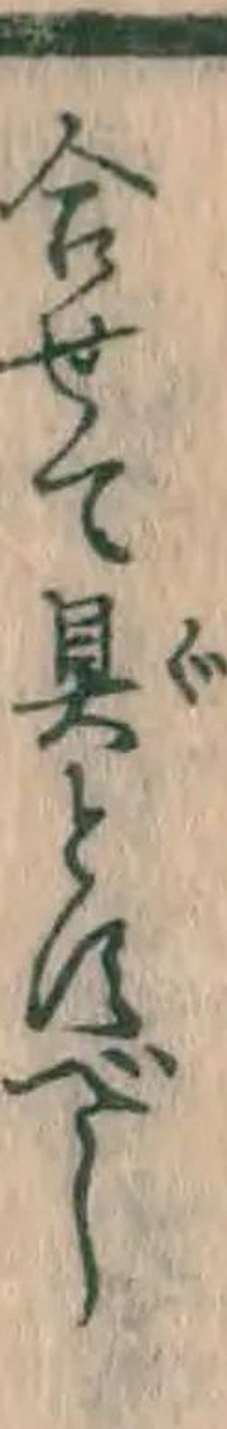合せて具とすべし
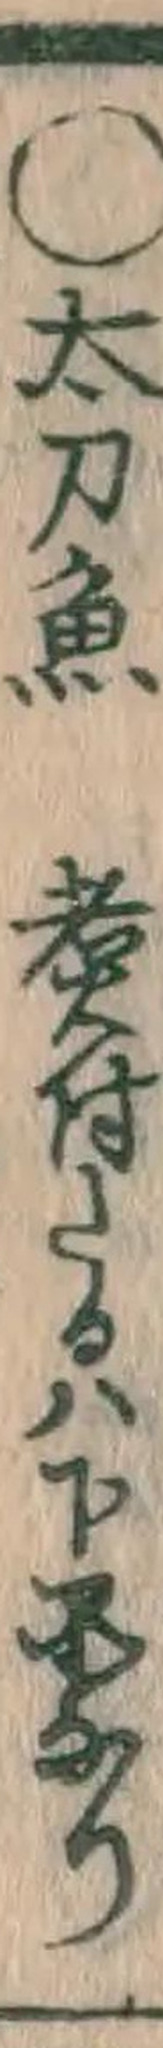○太刀魚煮付たるは下品なり
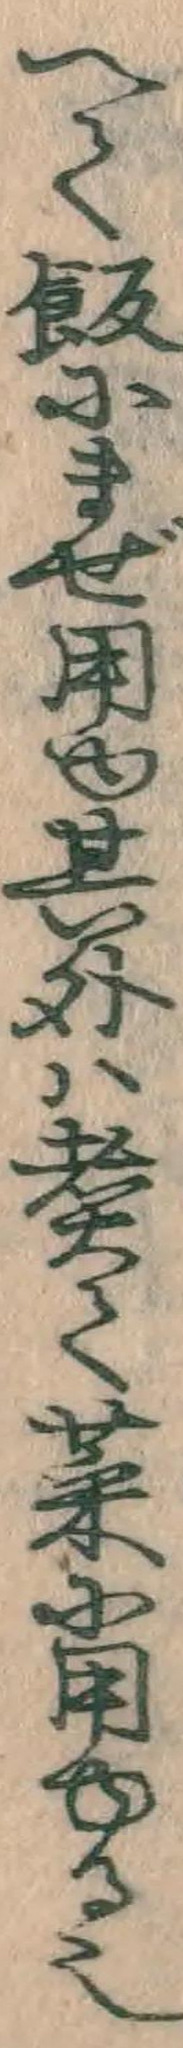へて飯にまぜ用ゆ其外は煮て菜に用ゆる也
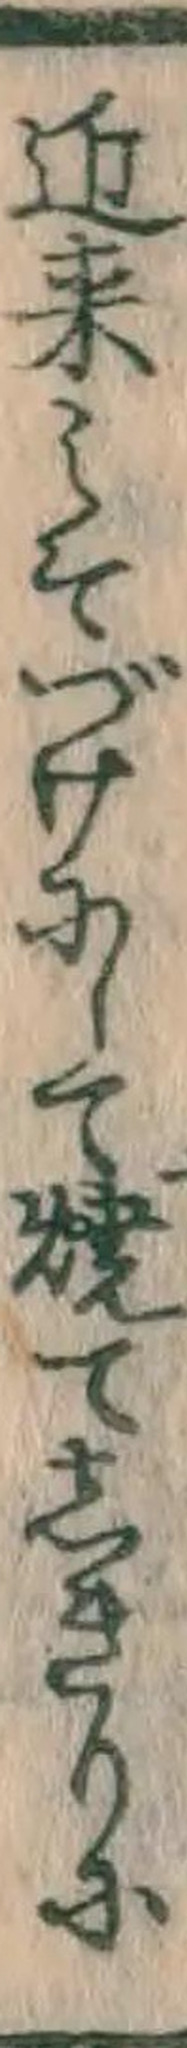近来みそづけにして焼てしきりに
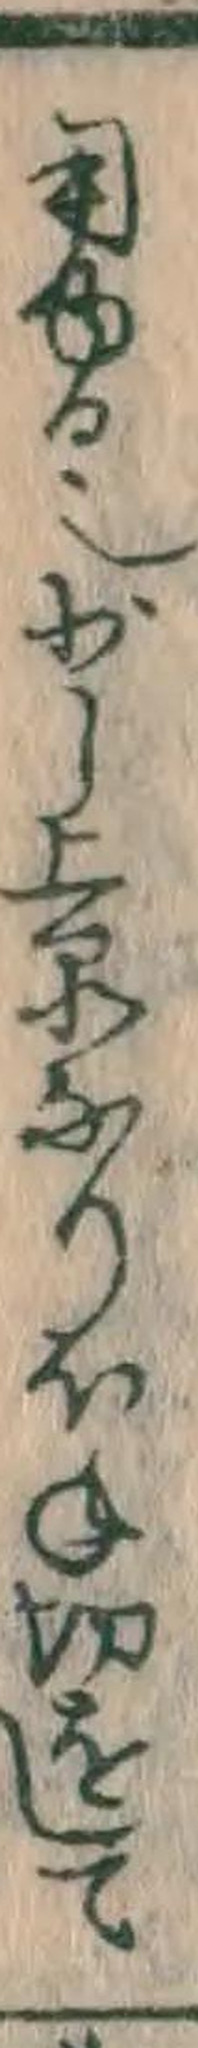用ゆる也少し上品なりほね切をして
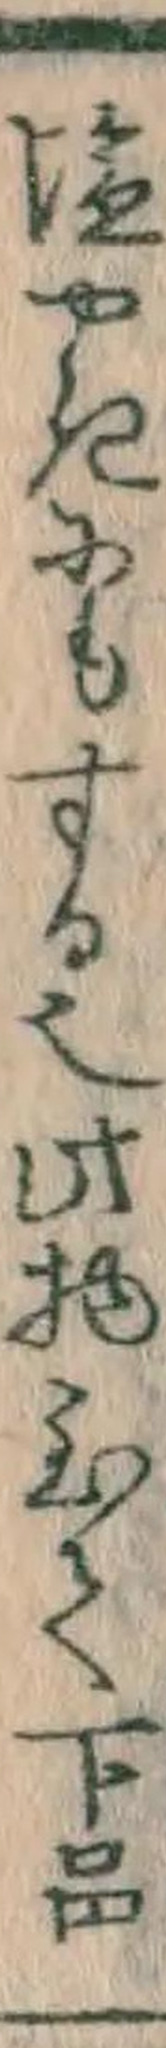塩やきにもする也此物至て下品
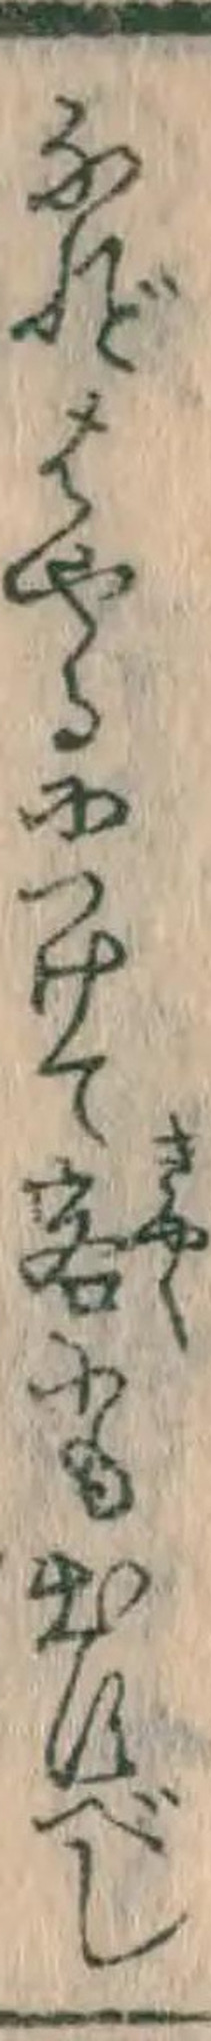なれどはやるにつけて客にも出すべし
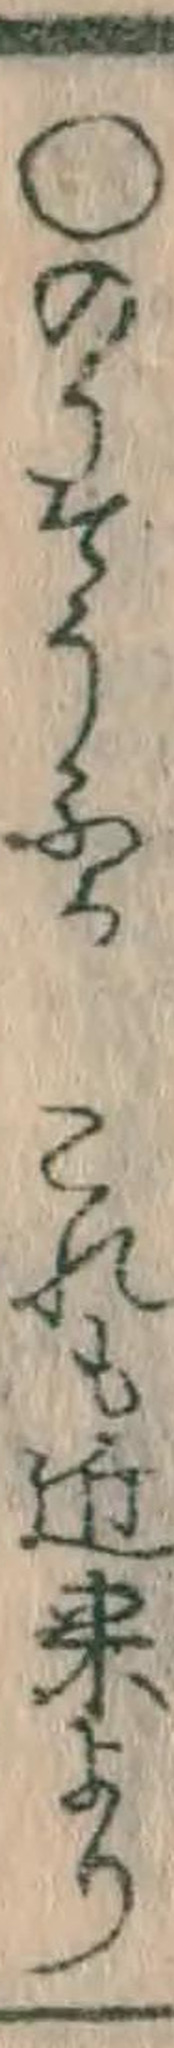○のうそうふかこれも近来より
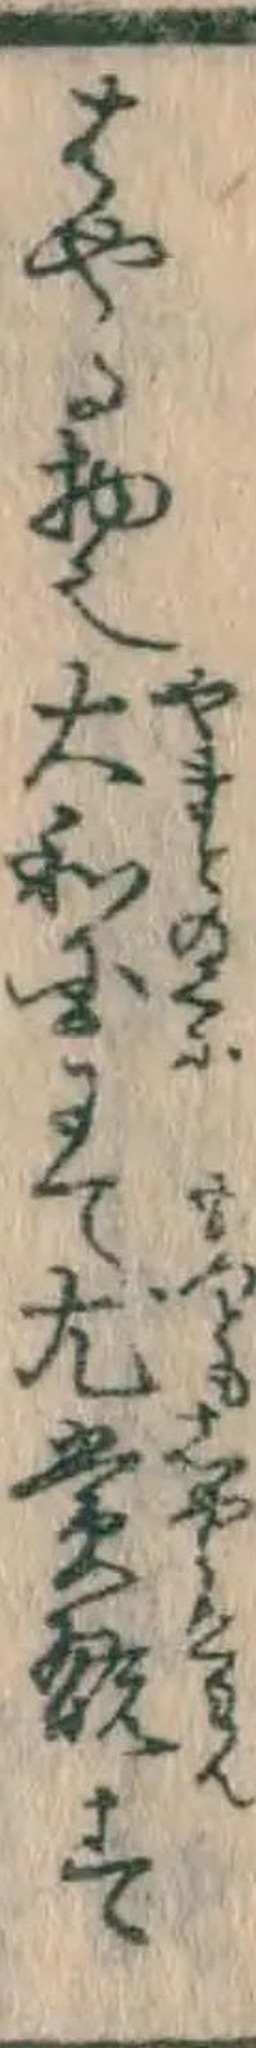はやる物也大和国にて尤賞翫す
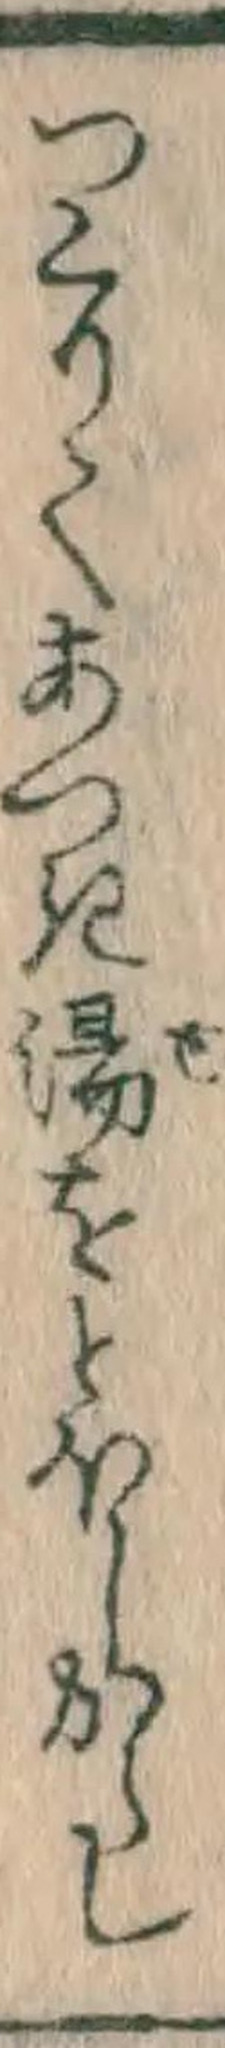つくりてあつき湯をとほしからし
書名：広益秘事大全 3巻. [5]
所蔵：国立国会図書館 National Diet Library, JAPAN
